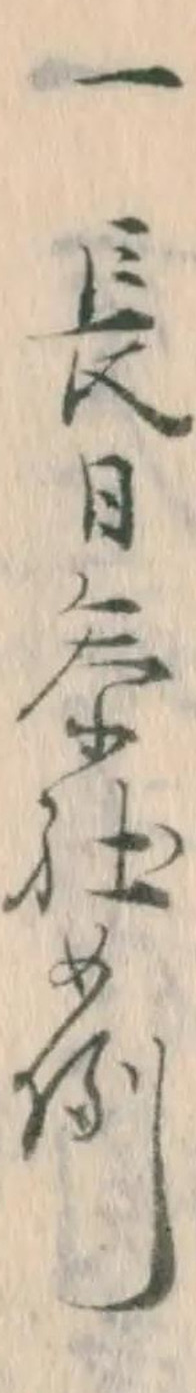一長日参社如例
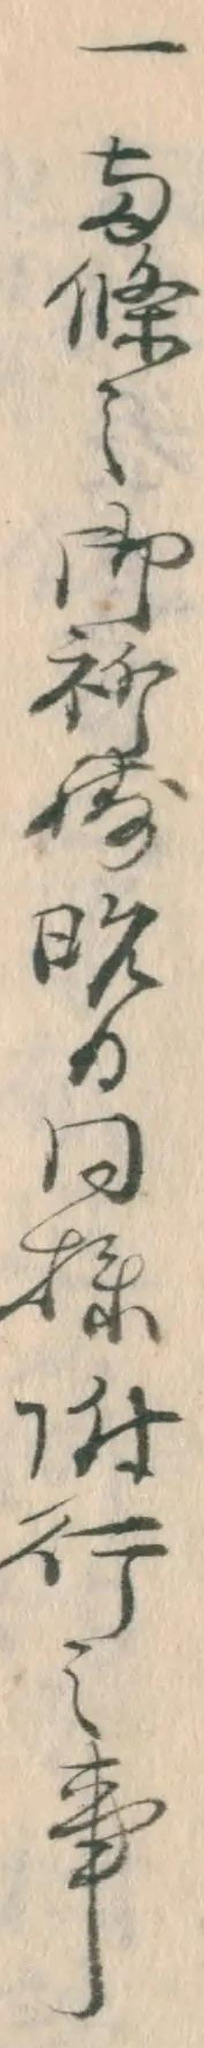一両條之御祈祷晩日同様附行之事
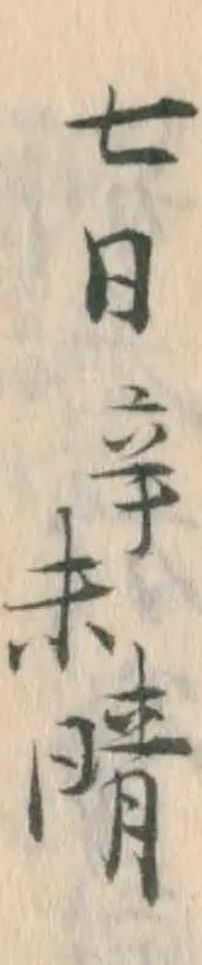七日辛未晴
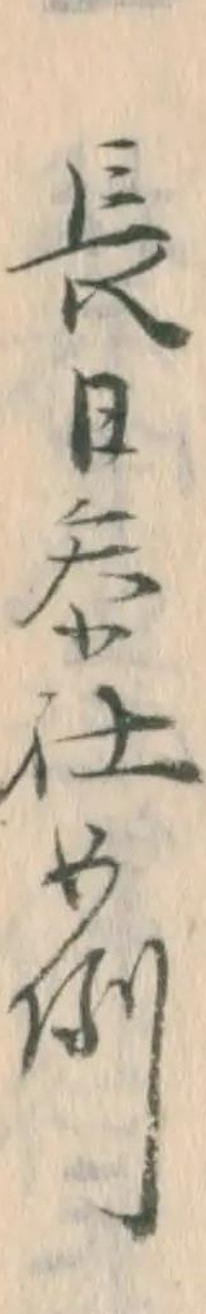一長日参社如例

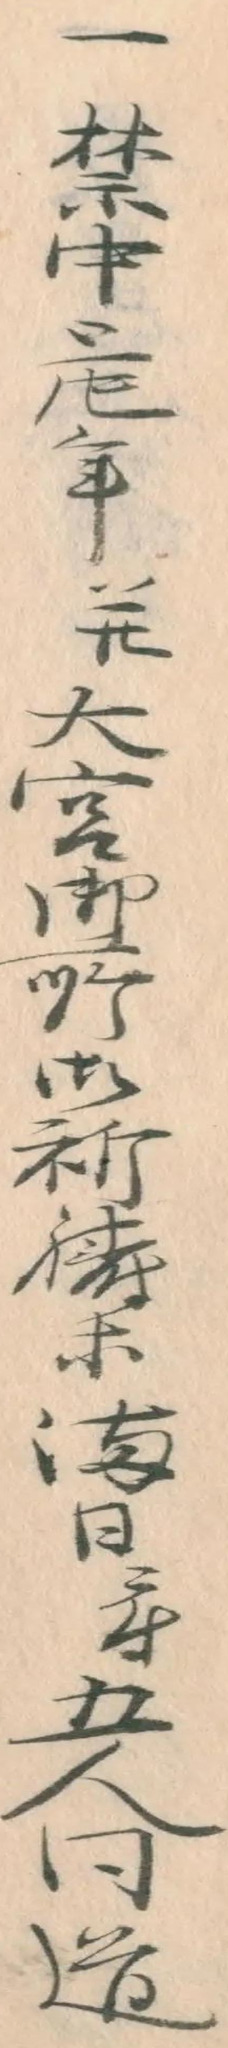一禁中御厄年并大宮御所御祈祷等満日ニ付五人同道
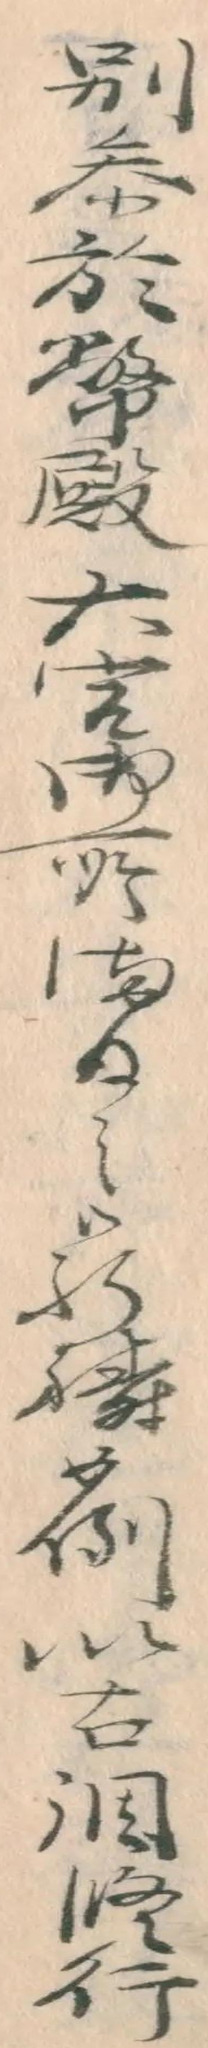別参於幣殿大宮御所満日之御祈祷如例以古調修行
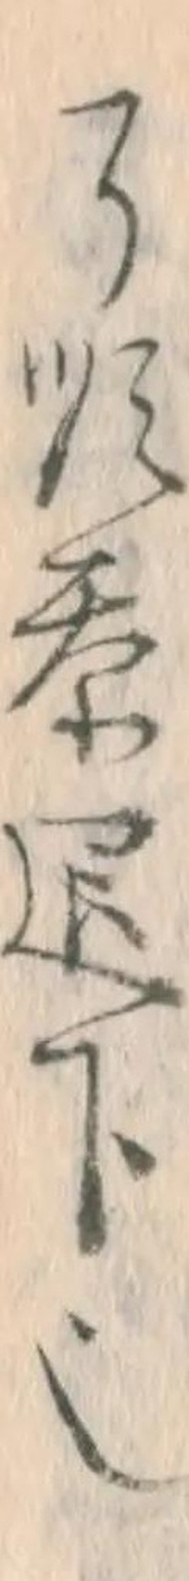了順退下也
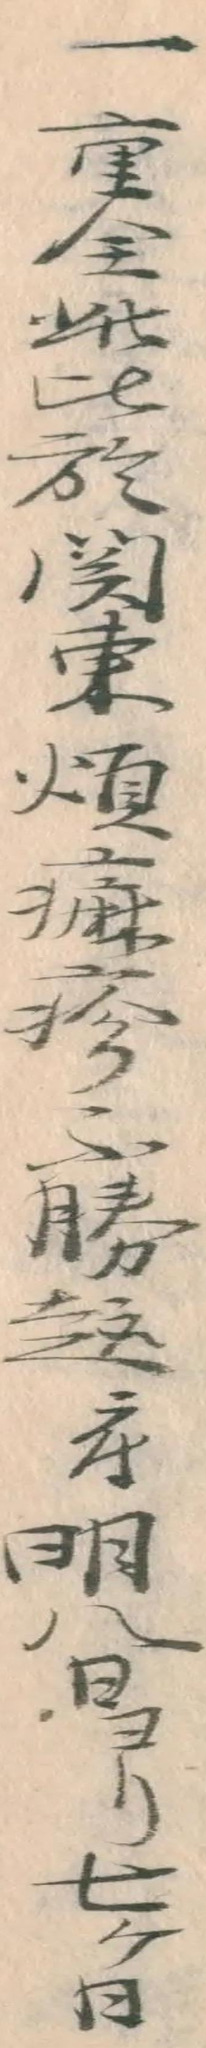一重全此比於関東煩麻疹不勝趣ニ付明八日ヨリ七ケ日
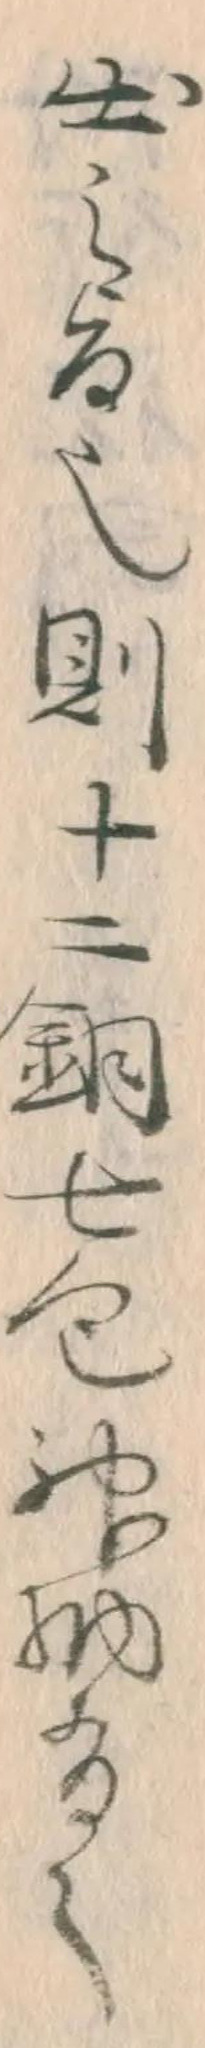出之旨也則十二銅七包神納有之
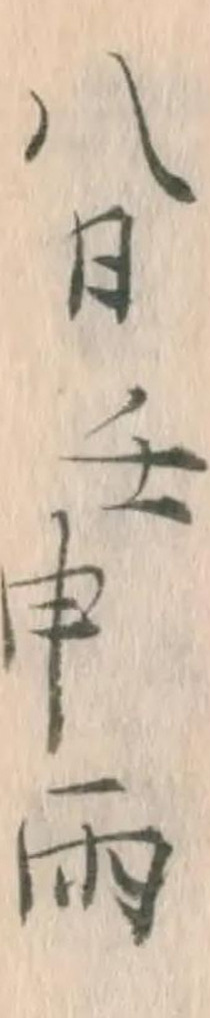八日壬申雨
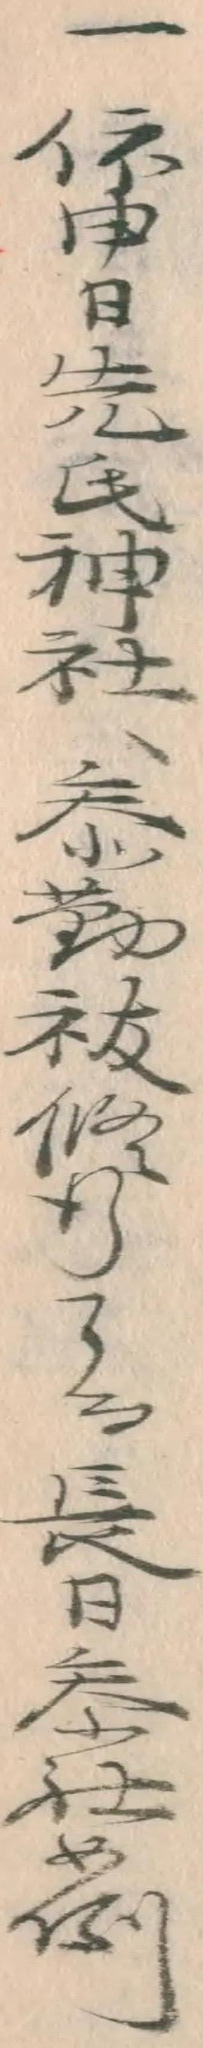一依申日先氏神社へ参勤祓修行了而長日参社如例
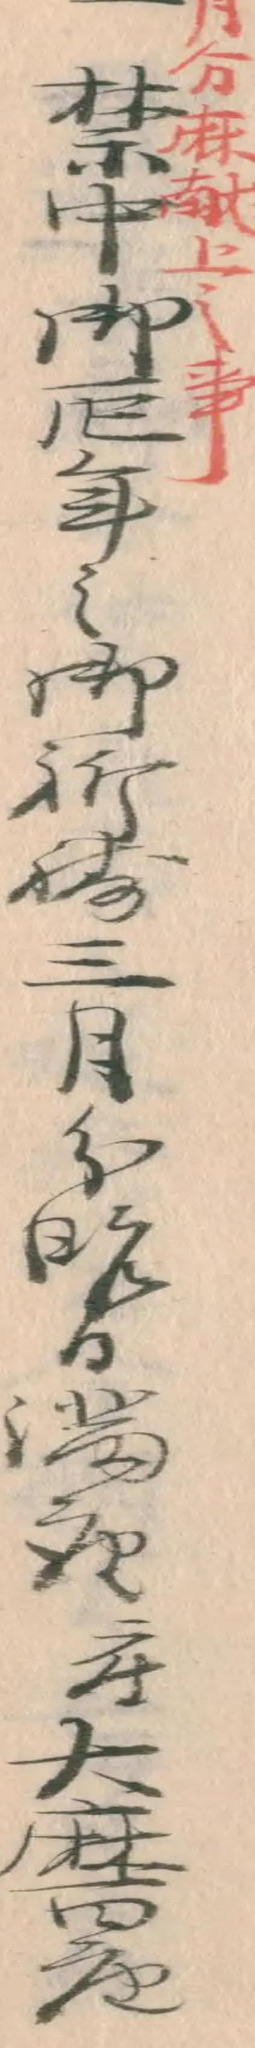一禁中御厄年之御祈祷三月分昨日満座ニ付大麻百座
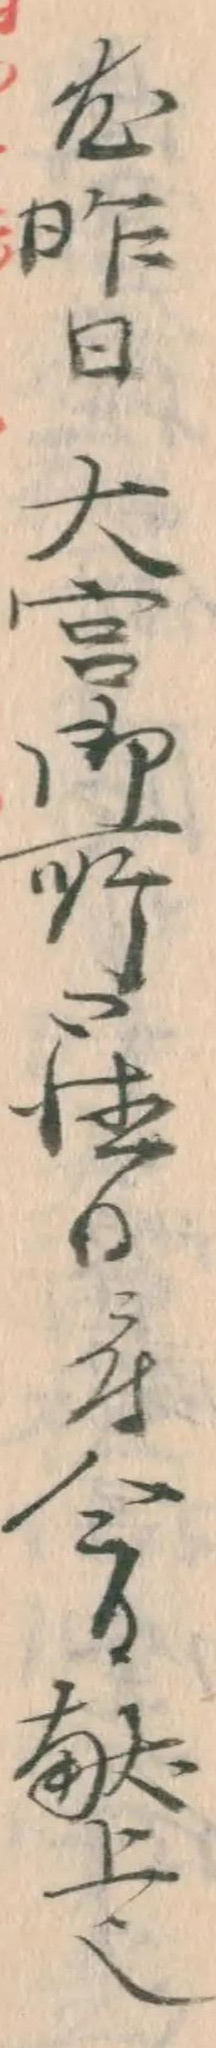尤昨日大宮御所御徳日ニ付今日献上也
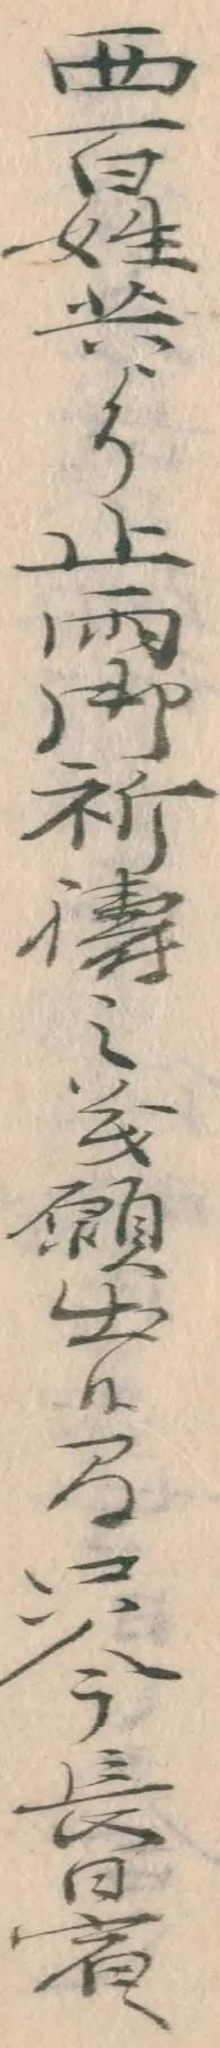西百姓共より止両御祈祷之義願出候間只今長日宿へ
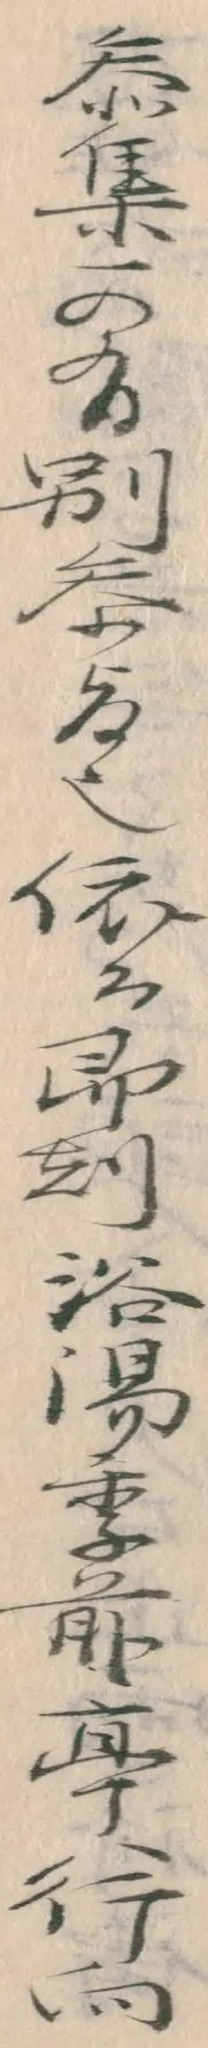参集可有別参旨也依而即刻浴湯季前亭へ行向
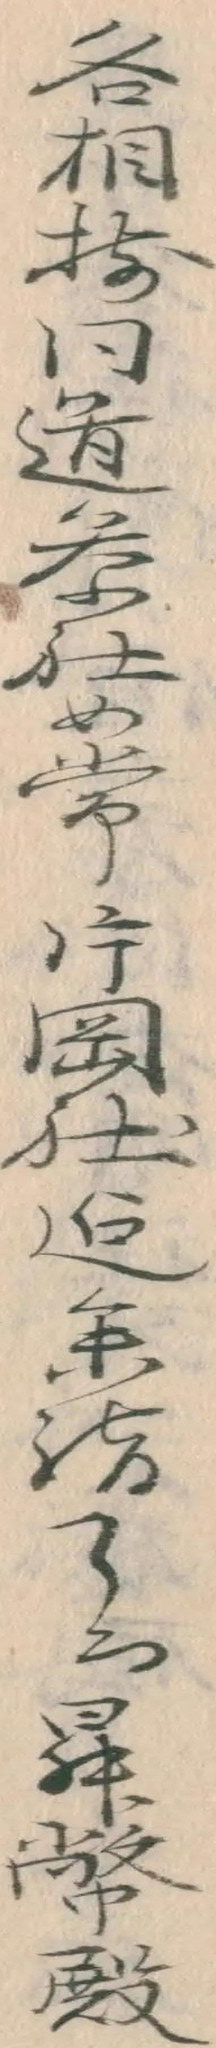各相揃同道参社如常片岡社迄参詣了而昇幣殿
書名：賀茂社記録. 第73冊
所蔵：国立国会図書館 National Diet Library, JAPAN
